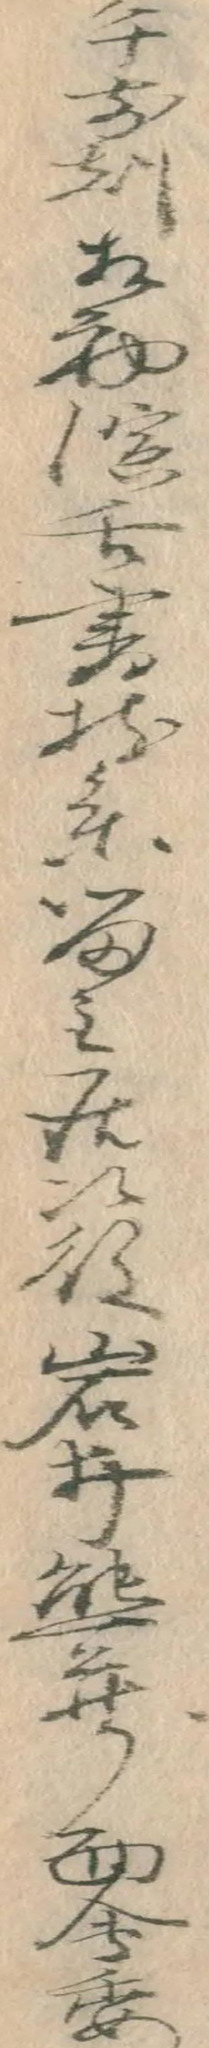午前刻相勤演舌書持参留守居以後岩井熊井ノ面會委

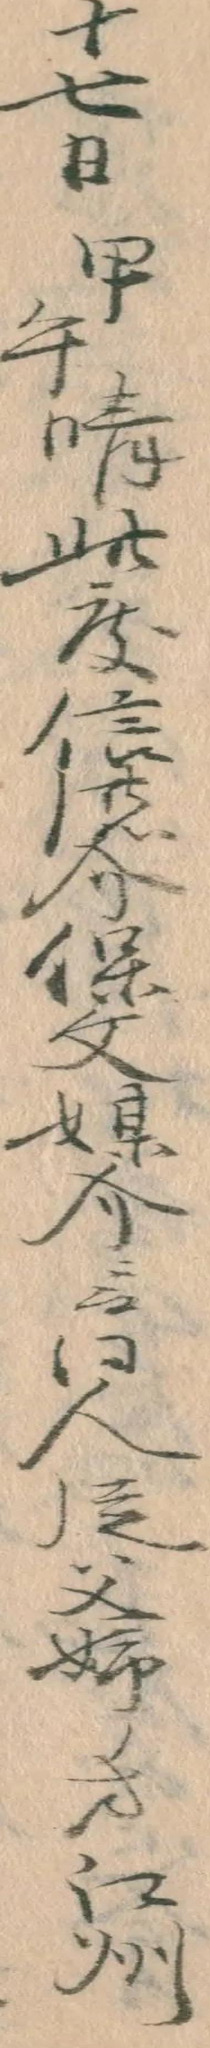十七日甲午晴此度信濃介保文媒介ニ而同人従父姉ノ方江州
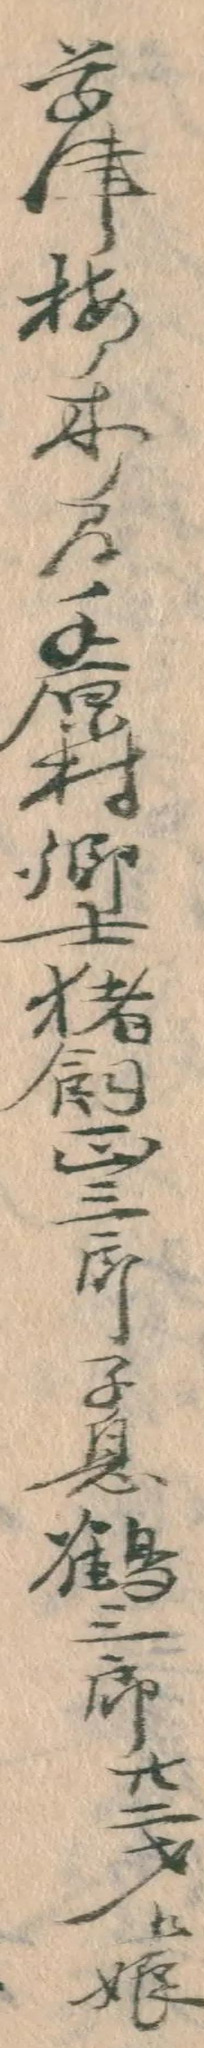草津梅ノ木ノ間千原村郷士猪飼正三郎子息鶴三郎廿二才江娘
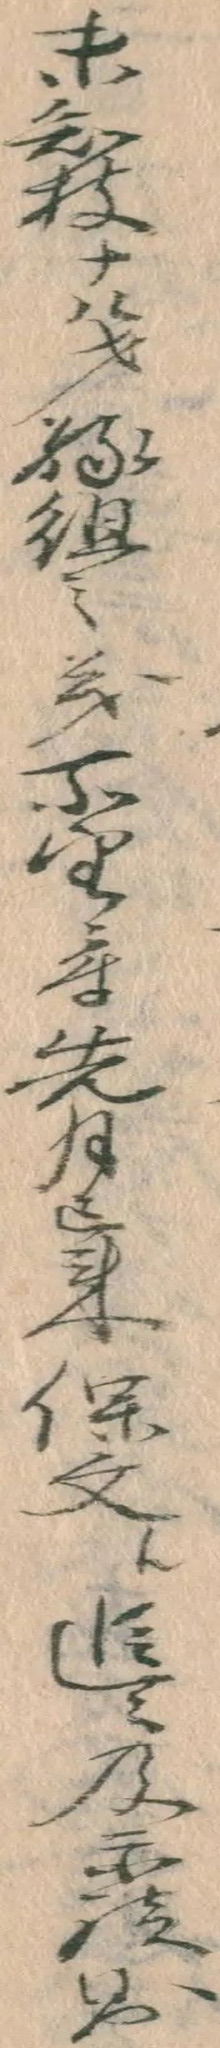未知枝十八才縁組之義所望ニ付先月已来保文え追々及示談則
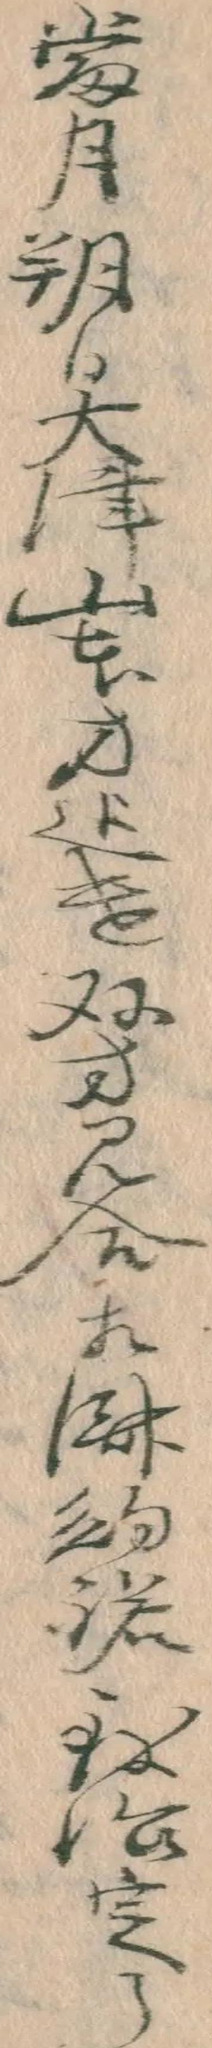當月朔日大津山本方迄遣双方見合相済諾致治定了
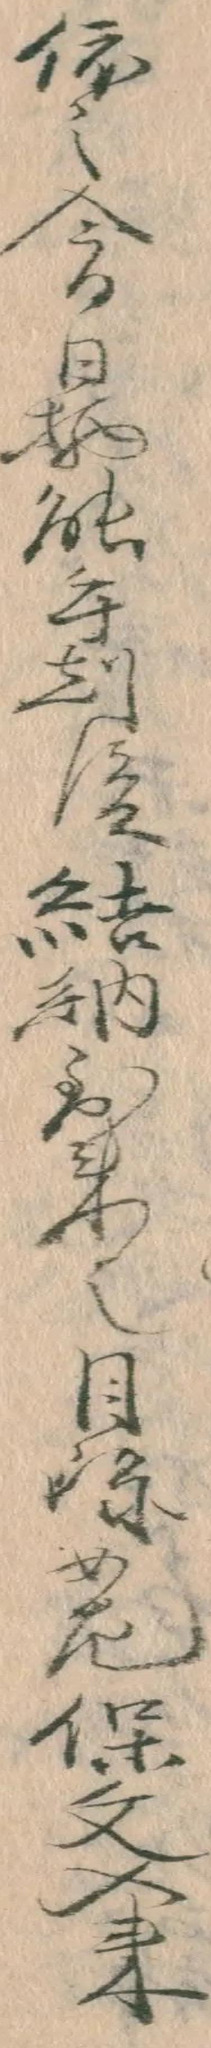依之今日日柄能午刻後結納到来也目録如左保文入来
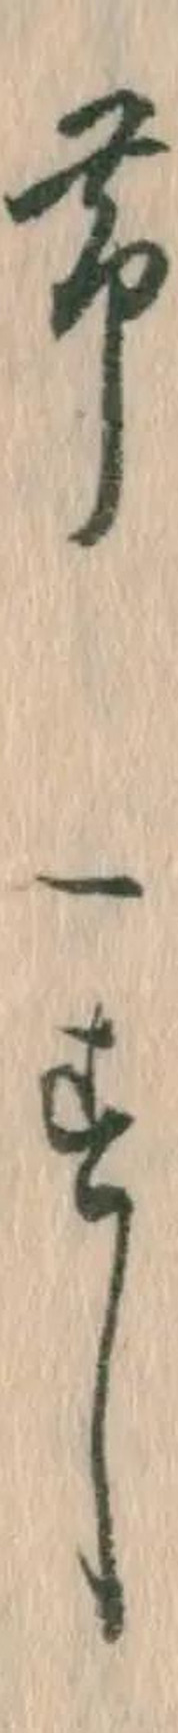節一すし
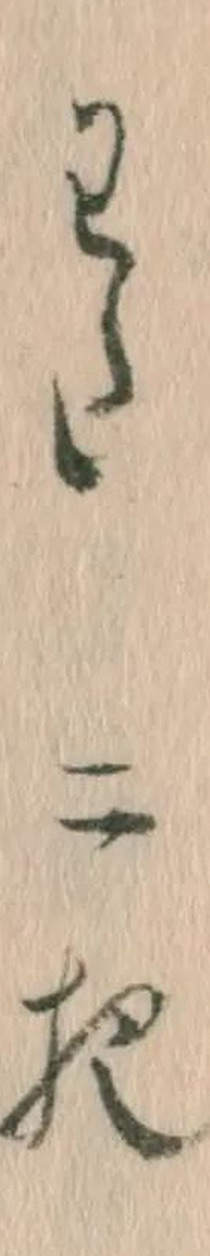わた二把
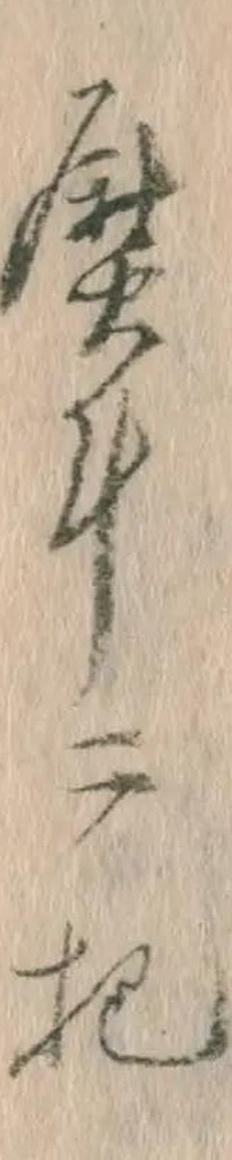熨斗二把
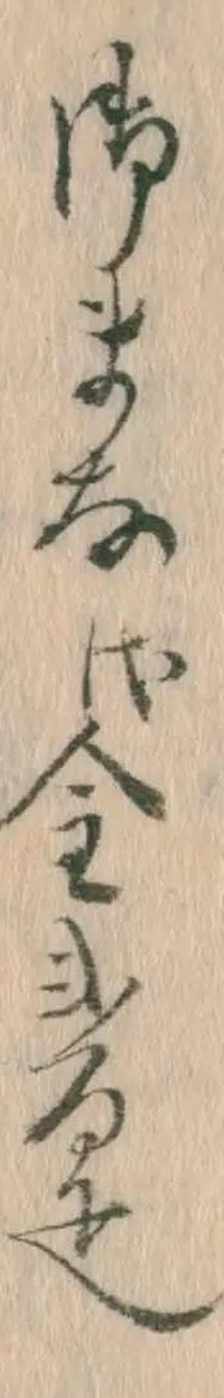御まな代金弐百疋
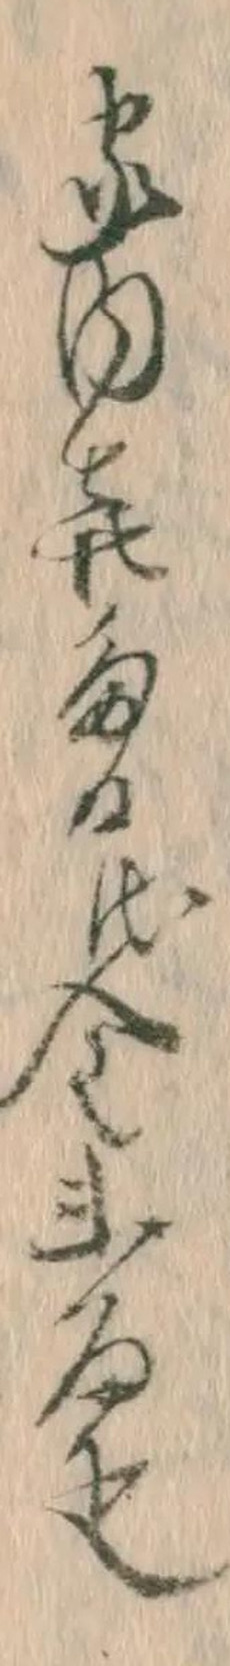家内喜多日代金弐百疋
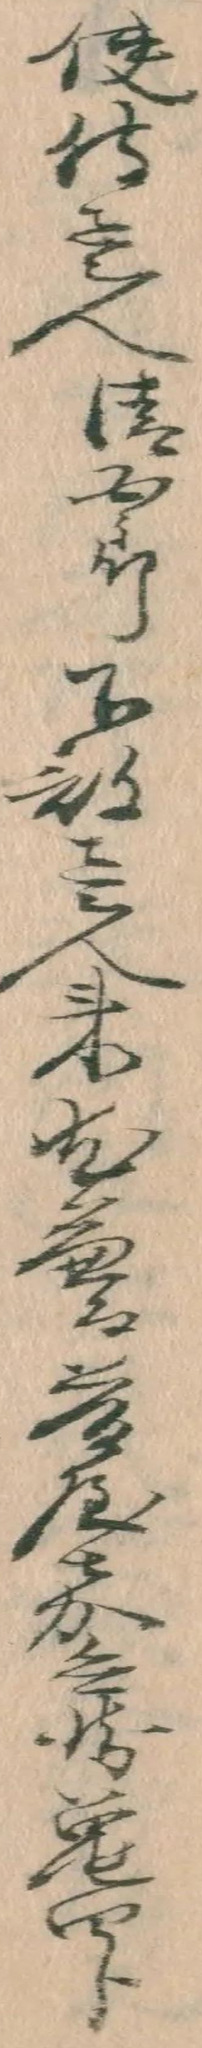使侍壱人清五郎下部壱人来尤兼而藤屋嘉兵衛亀四郎
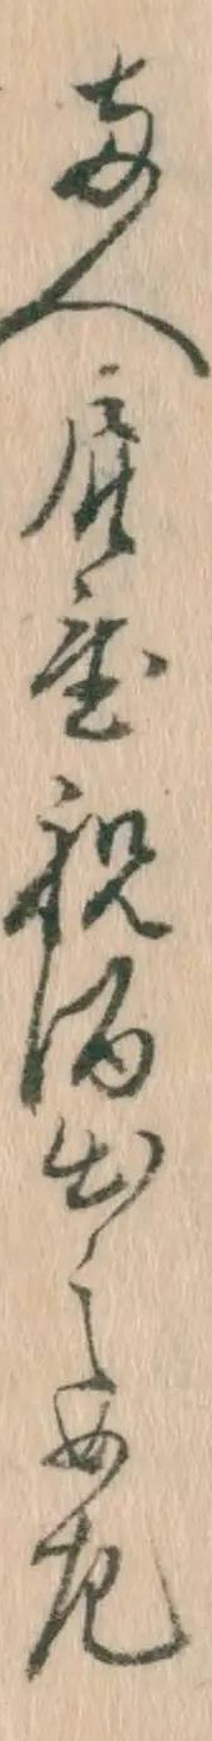両人雇置祝酒出之如左
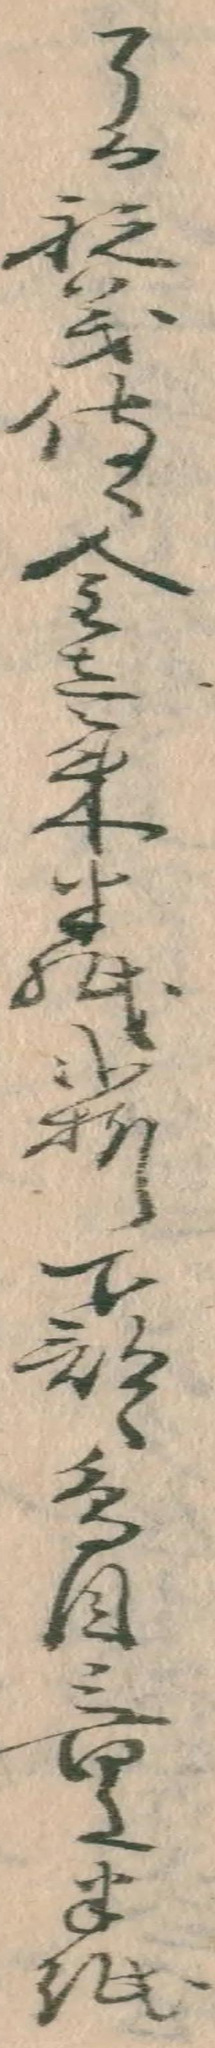了而祝義傳へ金壱朱半紙弐折下部へ鳥目三百文半紙
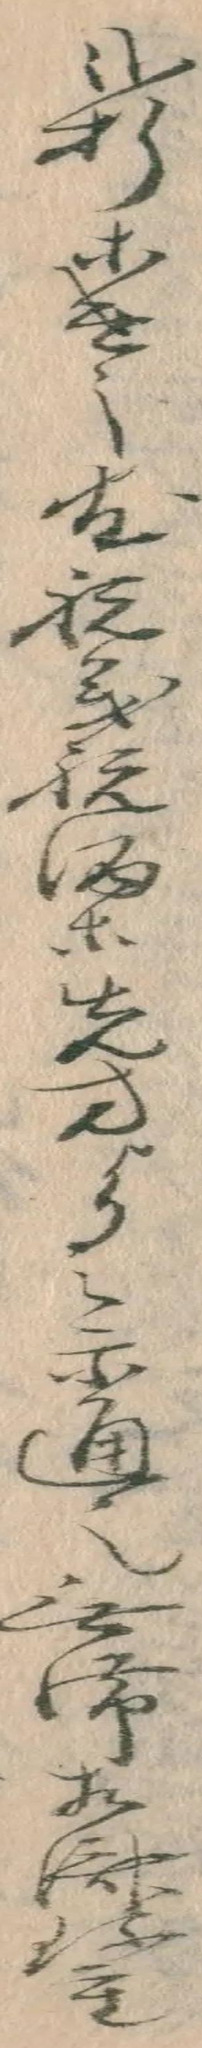弐折等遣之尤祝義祝酒等先方より之示通也無滞相済珍重々々
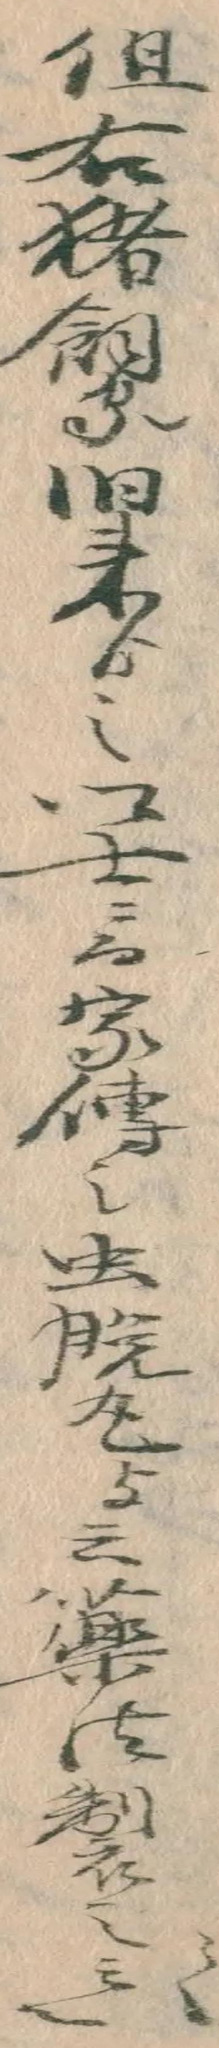但右猪飼旧来ゟ之郷士ニ而家傳之虫脱丸と云薬法製之云々
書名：賀茂社記録. 第66冊
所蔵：国立国会図書館 National Diet Library, JAPAN
